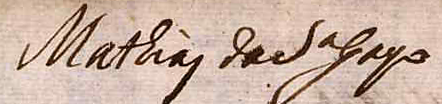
Mathias da S.a Gayo
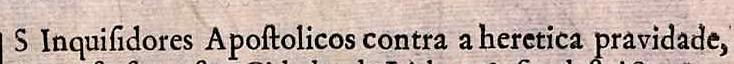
S Inquisidores Apostolicos contra a heretica pravidade,
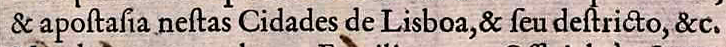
& apostasia nestas Cidades de Lisboa, & seu destricto, &c.
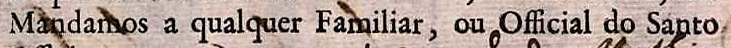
Mandamos a qualquer Familiar, ou Official do Santo,
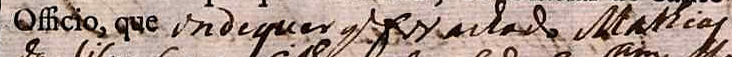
Officio, que onde quer q̄ for achado Mathias
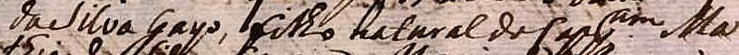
da Silva Gayo, filho natural do Cappa.m Ma
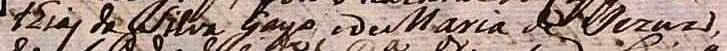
thias da Silva Gayo, e de Maria de Iezuz,
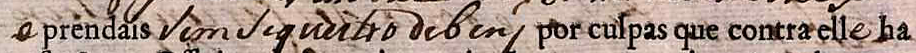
o prendais sem sequestro de bens por culpas que contra elle ha
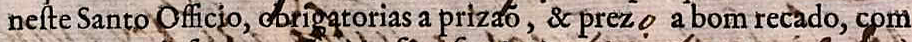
neste Santo Officio, obrigatorias a prizaõ, & prezo a bom recado, com
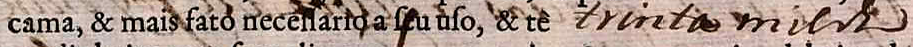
cama, & mais fato necessario a seu uso, & tè trinta mil rs̄
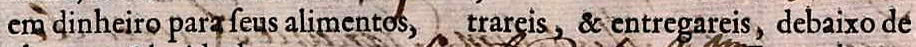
em dinheiro para seus alimentos, trareis, & entregareis, debaixo de
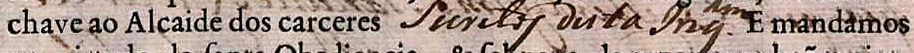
chave ao Alcaide dos carceres Secretos desta Inq.am mandamos
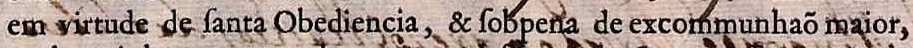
em virtude de santa Obediencia, & sob pena de excommunhaõ maior,
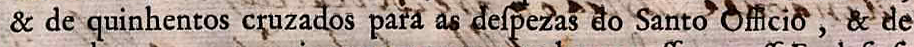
& de quinhentos cruzados para as despezas do Santo Officio, & de
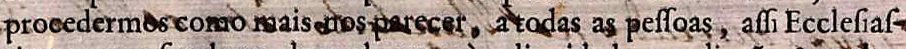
procedermos como mais nos parecer, a todas as pessoas, assi Ecclesias
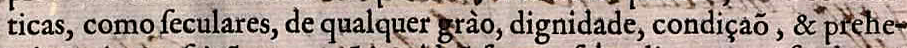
ticas, como seculares, de qualquer grào, dignidade, condiçaõ, & prehe
